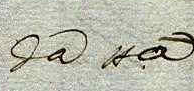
2a tt.a
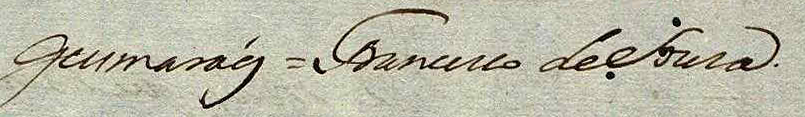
Guimaraés = Francisco de Souza.
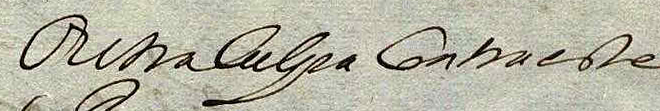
Outra Culpa Contra este
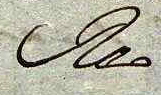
Reo
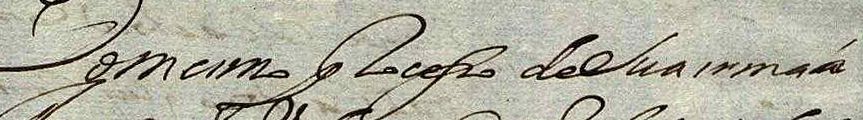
Do mesmo processo de Sua irmaã
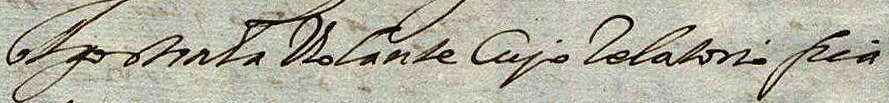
Agostinha Violante Cujo Relatorio fica
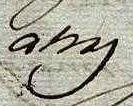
atras
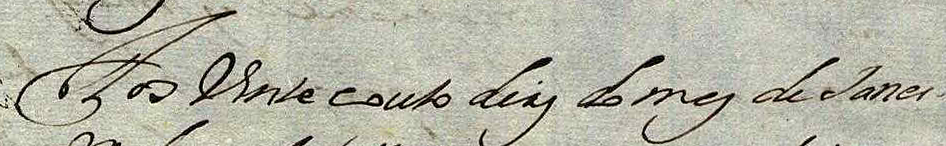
Aos Vinte e outo dias do mes de Ianei
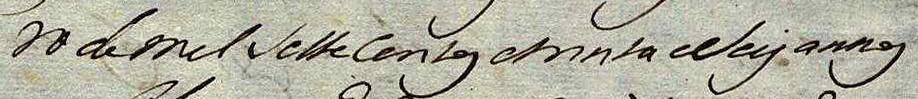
ro de mil settecentos e trinta e seis annos
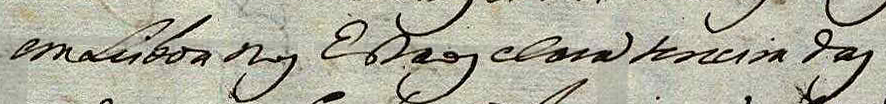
em Lisboa nos Estaos e caza terceira das
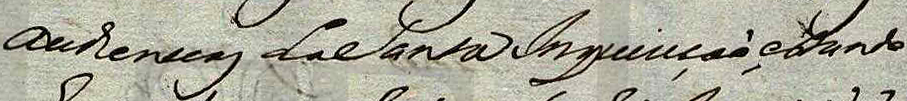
audiencias da Santa Inquiziçaõ, estando
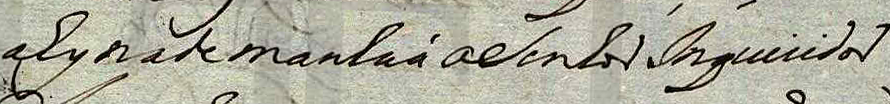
ahy na de manhaã o Senhor Inquizidor
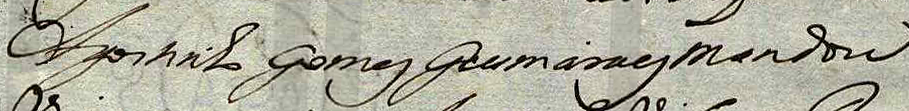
Agostinho Gomes Guimaraes mandou
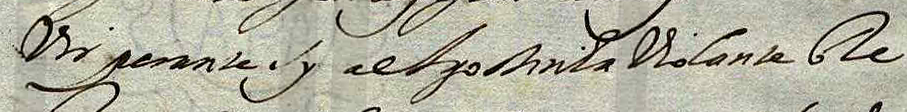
Vir perante sy a Agostinha Violante Re
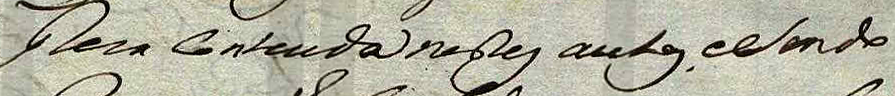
preza conteuda nestes autos, e sendo
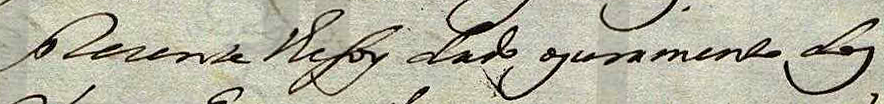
pRezente lhe foy dado o juramento dos
